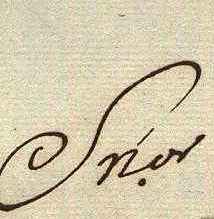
Sn̄.or
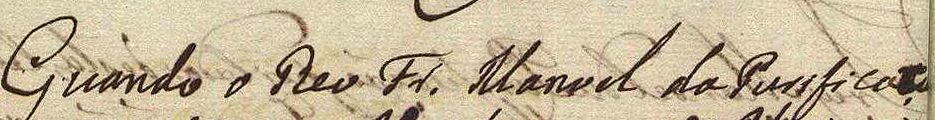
Quando o Reo Fr. Manoel da Purificaça
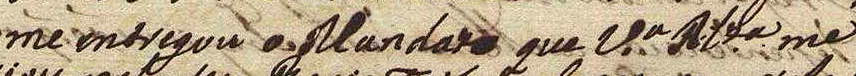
me entregou o Mandato que V.a Al.ta me
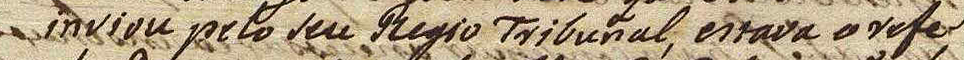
inviou pelo seu Regio Tribunal, estava o refe
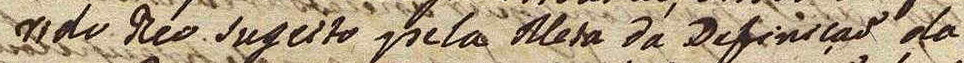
rido Reo sugeito pela Mesa da Definiçaõ da
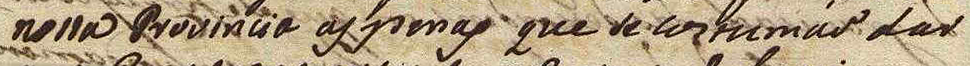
nossa Provincia as penas que se costumaõ dar
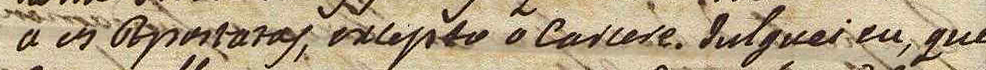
aos Apostatas, excepto o carcere. Iulguei eu, que
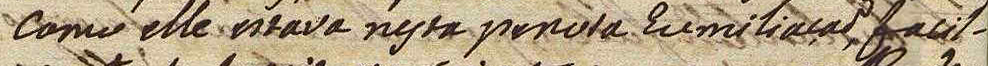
como elle estava nesta penosa humiliaçaõ, facil
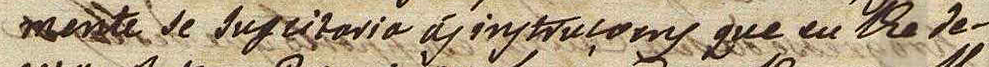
mente se sugeitaria ás instruçoens que eu lhe de
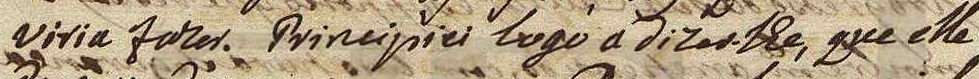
viria fazer. Principiei logo a dizer-lhe, que elle
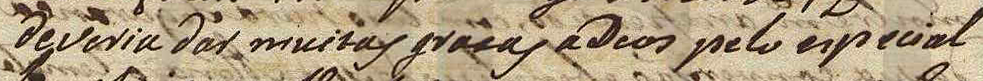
deveria dar muitas graças a Deos pelo especial
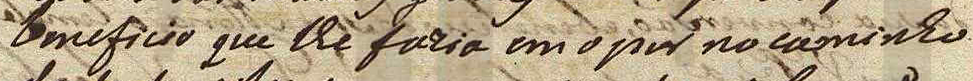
beneficio que lhe fazia em o por no caminho
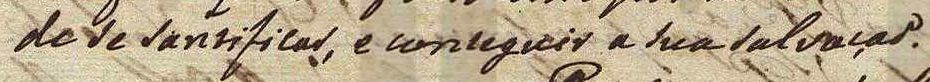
de se santificar, e conseguir a sua salvaçaõ.
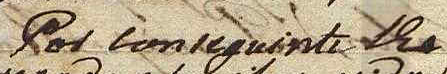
Por conseguinte lhe
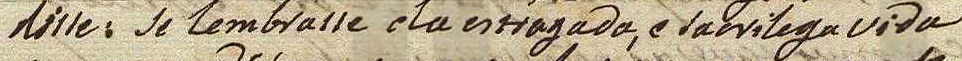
disse: se lembrasse da estragada, e sacrilega vida
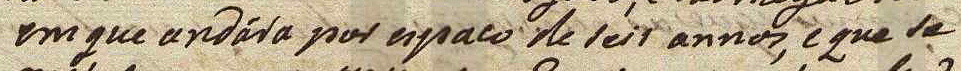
em que andára por espaço de seis annos, e que se
